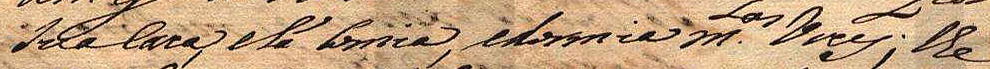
sua caza, e lá Comia, e dormia m.tas Vezes; lhe
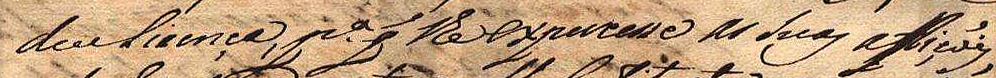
deu Licença, p.a q̄ lhe expuzesse as suas afliçõis,
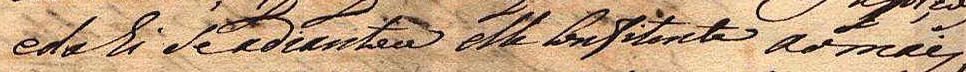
e dahi se adiantou elle Confitente ao mais,
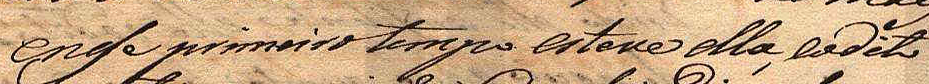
onde primeiro tempo esteue ella, e o dito
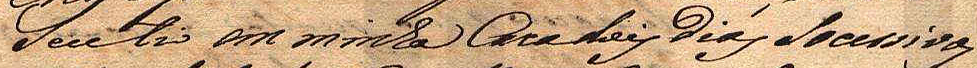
seu tio em minha Caza dois dias socessivos
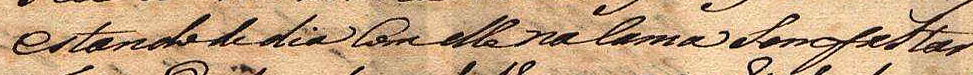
estando de dia Com elle na Cama Sam faltar
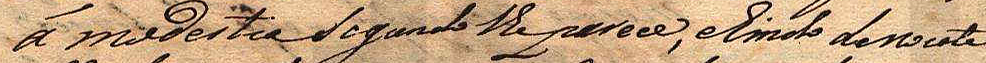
á modestia segundo lhe parece, e hindo de noute
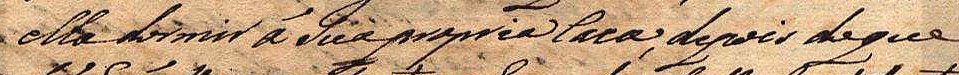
ella dormir á sua propria Caza, depois de que
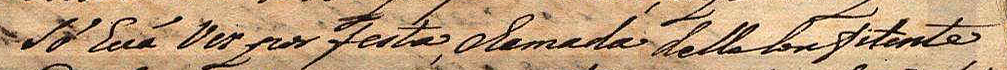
só huā vez por festa, chamada delle Confitente
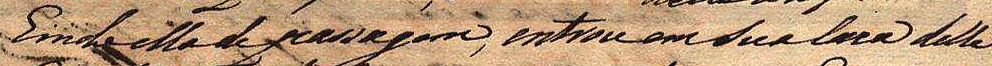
hindo ella de passagem, entrou em sua Caza delle
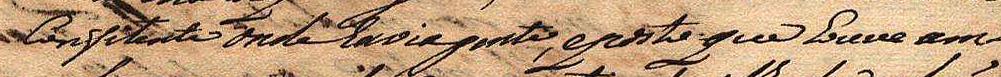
Confitente onde havia gente, e posto que houue am
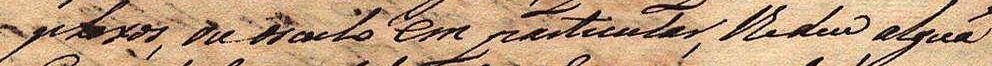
plexos, ou osculo em particular, lhe deu alguā
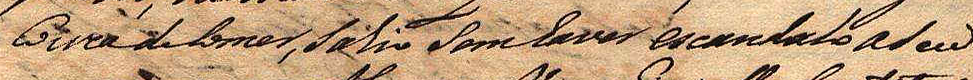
Couza de Comer, sahio sem haver escandalo a seu
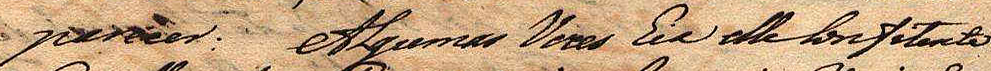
parecer: Algumas Vezes hia elle Confitente
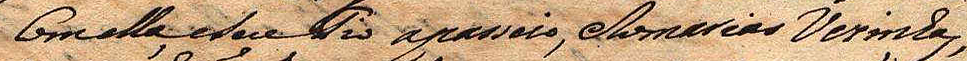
Com ella, e seu Tio a passeio, Romarias Vezinhas,
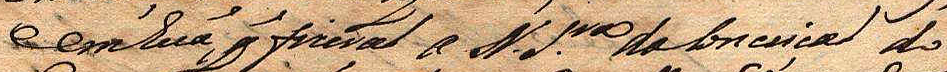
e em huā, q̄ fizeraõ a N. S.ra da Conceiçaõ do
